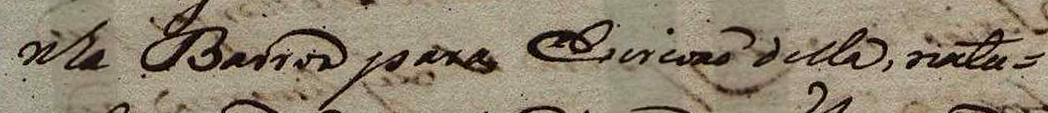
nha Barros para Escrivaõ della, natu
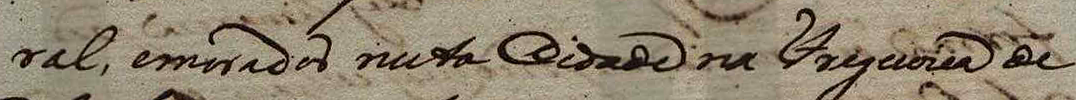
ral, e morador nesta Cidade na Freguezia de
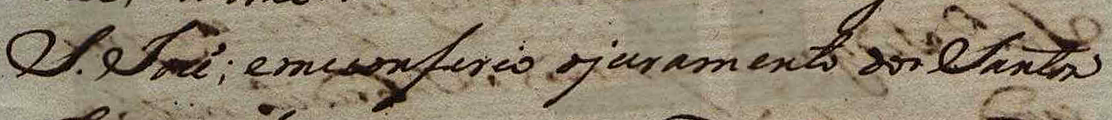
S. Iozé; e me conferio o juramento dos Santoz
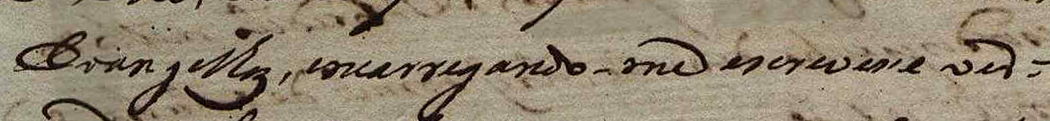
Evangelhoz, encarregando-me escrevesse ver
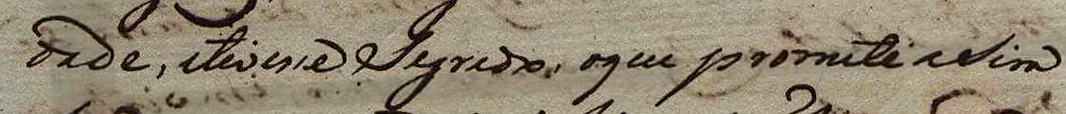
dade, e tivesse Segredo, o que prometi aSim
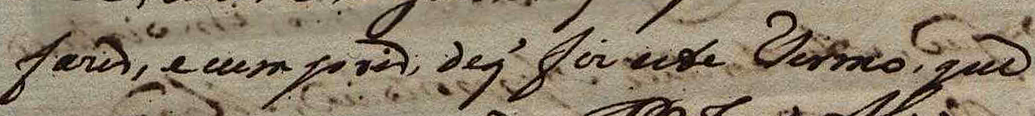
faria, e cumprir, de q̄ fiz este Termo, que
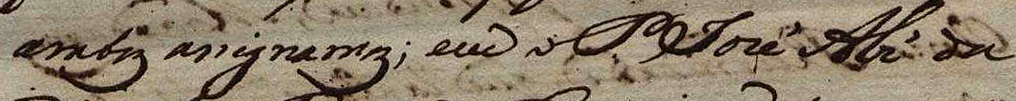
amboz assignamoz, e eu o P. Iozé Alz̄ da
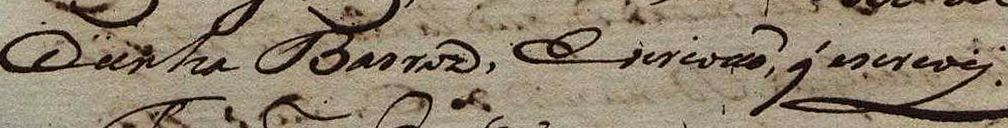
Cunha Barroz, Escrivaõ, q̄ escrevi.
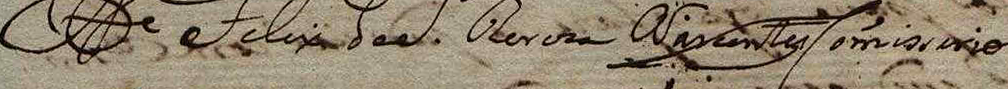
Fr Felix de S.ta Thereza Nascentes Com̄issario
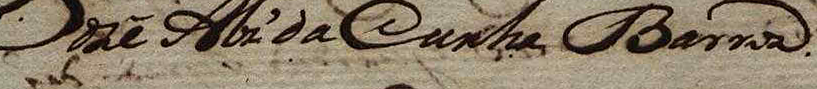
ozé Alz̄ da Cunha Barroz.
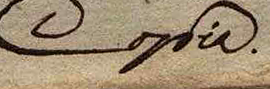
Copia.
